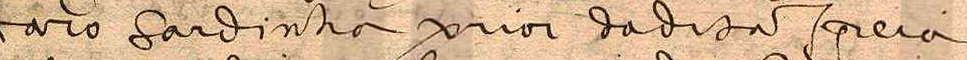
caro sardinha prior da dita Jgreia
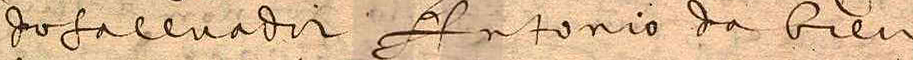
do salluador Antonio dabreu
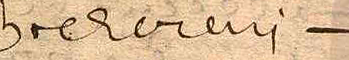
ho escreuj -
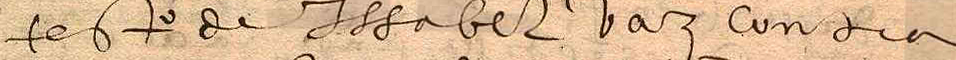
testo de Jssabel vaz contra
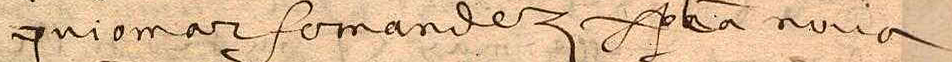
guiomar fernandez xpa̅a noua
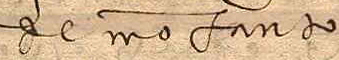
de m̅osanto
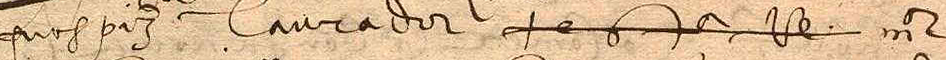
guos piz̅ laurador _ mor
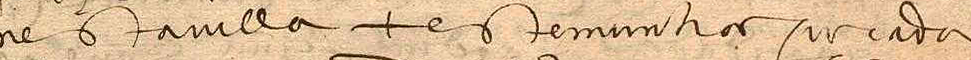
nesta uilla testemunha jurada
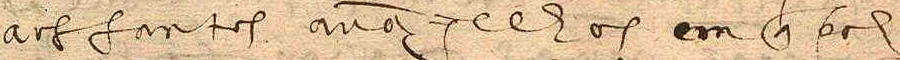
aos santos au̅angelhos em q̅ pos
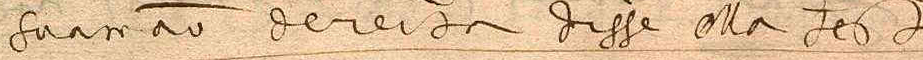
sua mão dereita disse ella testa
